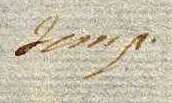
temp.
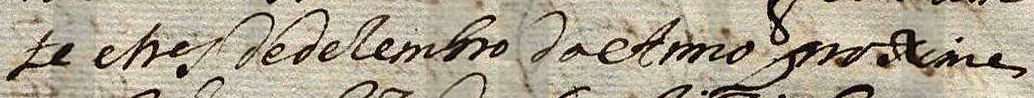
te e tres de dezembro do Anno proxime
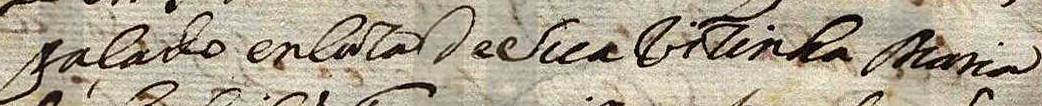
paÇado en Caza de Sua vizinha Maria
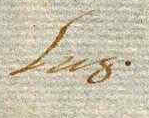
Lug.
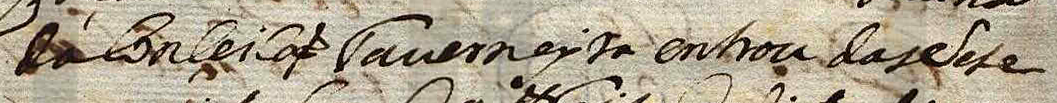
da ConCeiÇaõ Tauerneyra entrou das Sete
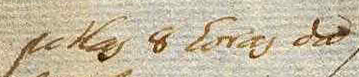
pellas 8 horas da
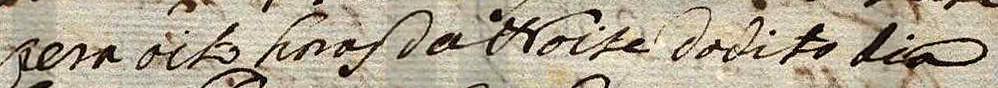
pera oito horas da Noite do dito dia
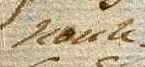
noute
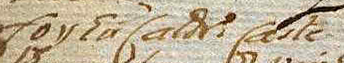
foy há Caldro. Caste
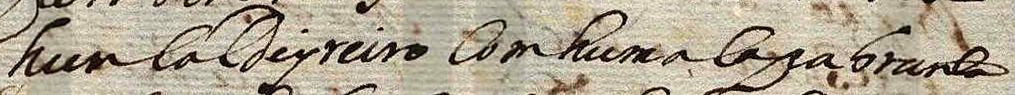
hum Caldeyreiro Com huma Capa branca
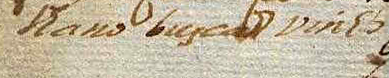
lhano buscar vinho
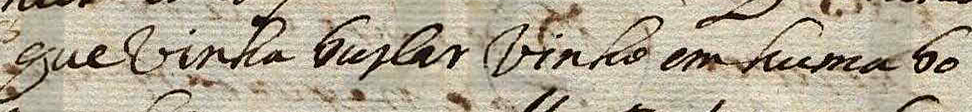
que vinha buscar vinho em huma bo
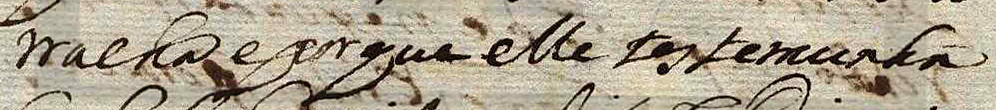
rracha e porque elle testemunha
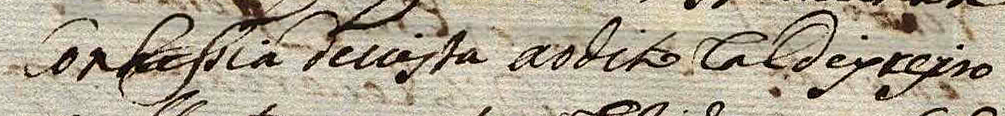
Conhessia de uista ao dito Caldeyrejro
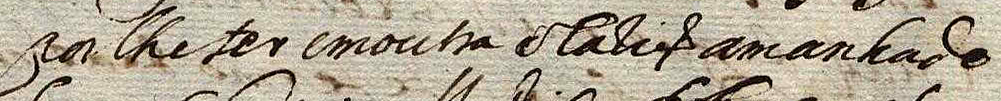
por lhe ter em outra ocaziaõ amanhado
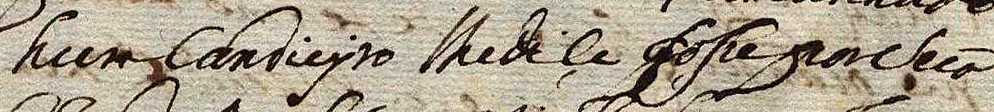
hum Candieyro lhe dice fosse por sua
